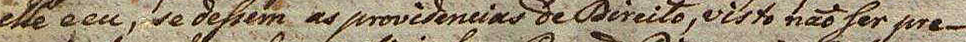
elle e eu, se dessem as providencias de Direito, visto naõ ser pre-
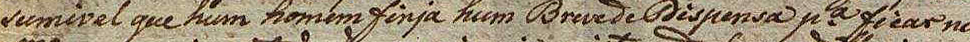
sumível que hum homem finja hum Breve de Dispensa p.a ficar no
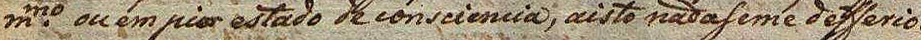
mmo. ou em pior estado de consciencia, a isto nada seme defferio.
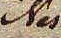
Nes
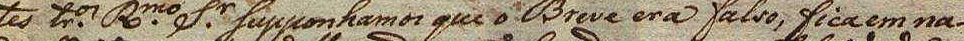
tes tr.os Rmo. S.r supponhamos que o Breve era falso, fica em na
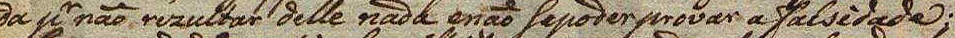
da pr não rezultar delle nada e não se poder provar a falsidade;
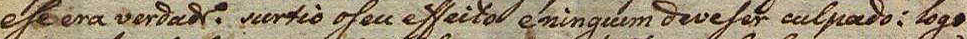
e se era verdadr.o surtio o seu effeito e ninguem deve ser culpado: logo
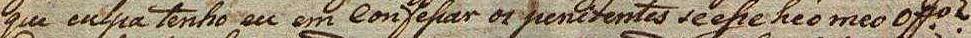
que culpa tenho eu em confessar os penitentes se esse he o meo off.o?
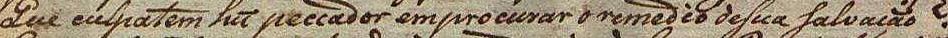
Que culpa tem hū peccador em procurar o remedio de sua salvação?
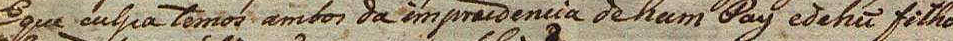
E que culpa temos ambos da imprudencia de hum Pay e de hū filho
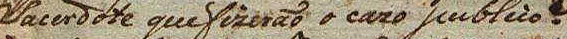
Sacerdote que fizerão o cazo publico?
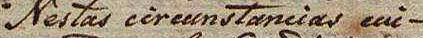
Nestas circunstancias cui
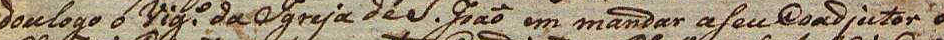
dou logo o Vig.o da Igreja de S. Joaõ em mandar a seu Coadjutor o
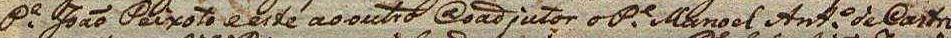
P.e João Peixoto e este ao outro Coadjutor o P.e Manoel Ant.o de Castro
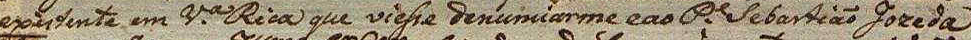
existente em V.a Rica que viesse denunciarme e ao P.e Sebastiaõ Joze da
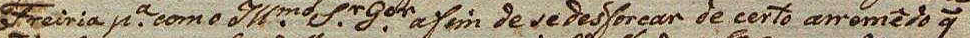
Freiria pa. com o Ill.mo S.r G.or afim de se desforçar de certo arremêdo q̄
